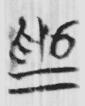爲
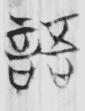語
